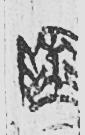陵
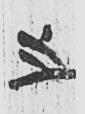之
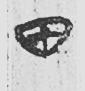田
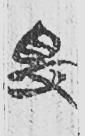{且又}
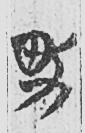男
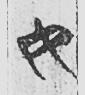女
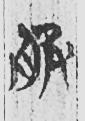服
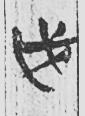戉
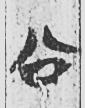公
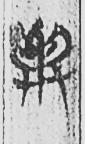與
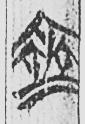齊
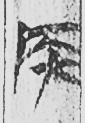侯
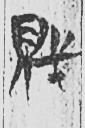{弋貝}
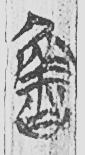魯
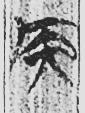侯
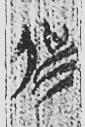侃
